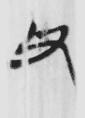父
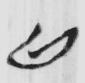㠯（以）
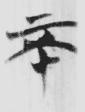不
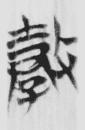{𣪊子}
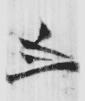之
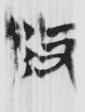攸
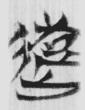遠
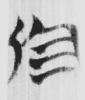於
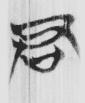君
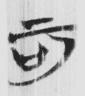可
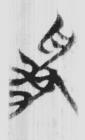爭
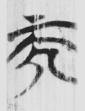而
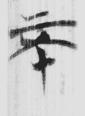不
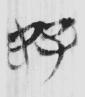好
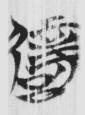辟
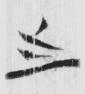之
